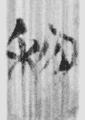利
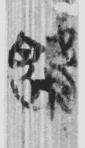{既火}
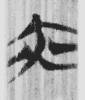亦
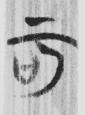可
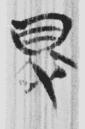𠭁
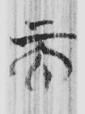而
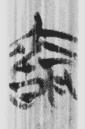{尒䎽}
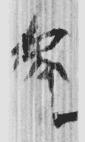虎
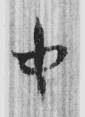中
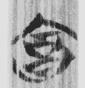合
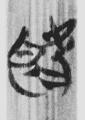既
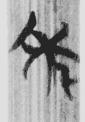年
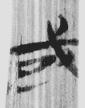或
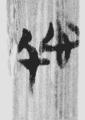忎
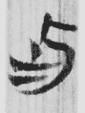此
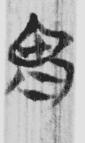胃
